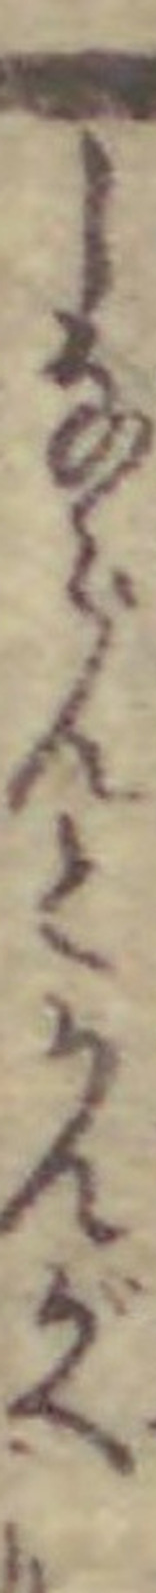しならんとかんがへ
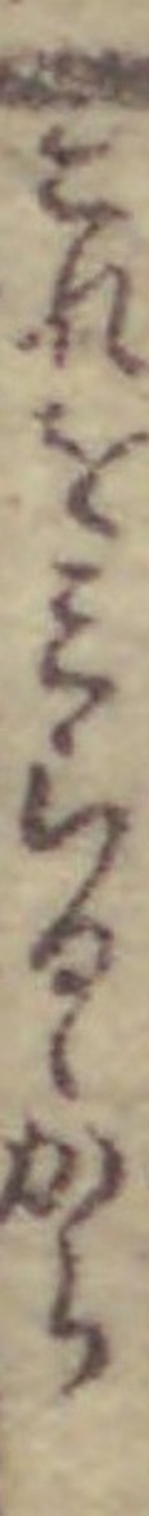これをみらるゝから
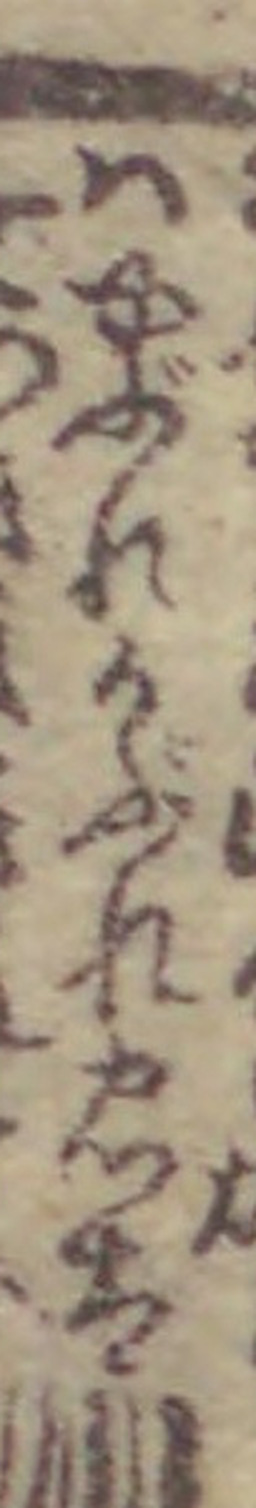はやぶれかぶれ忠太
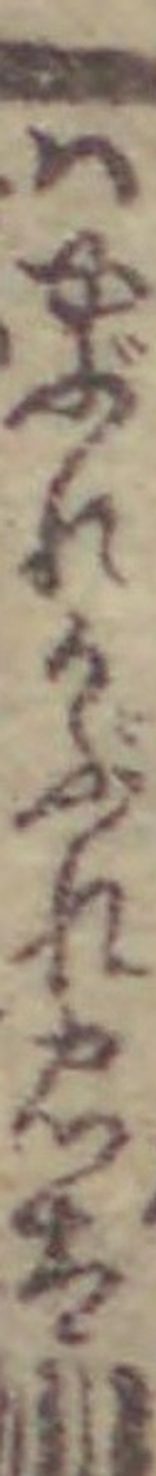はやぶれかぶれ忠太
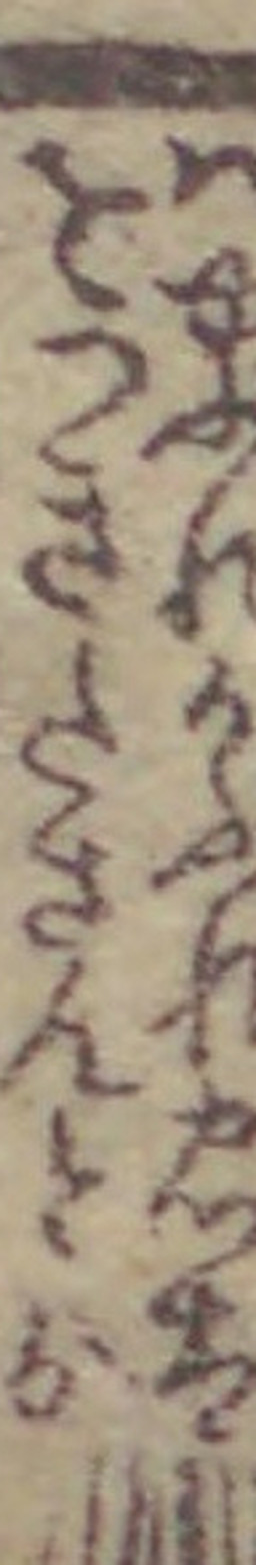をつきたさんとお
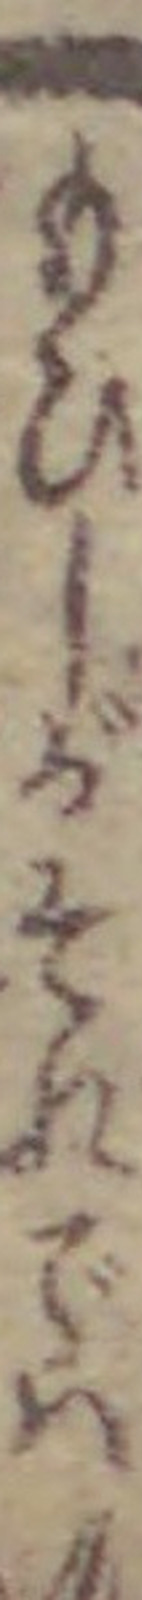もひしがそれでは
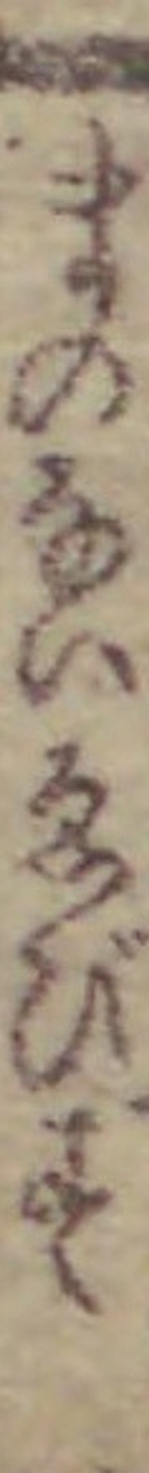まのないゑびす
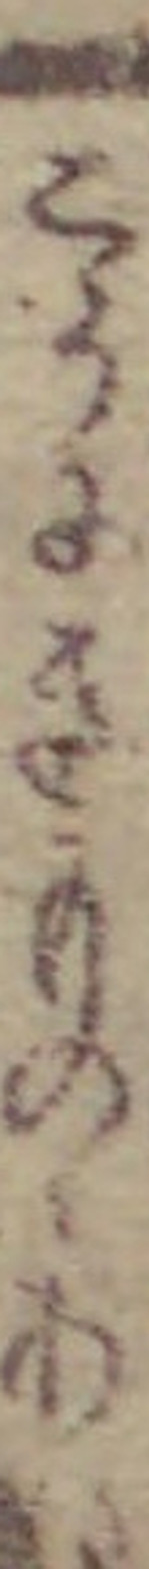こうにきものゝあ
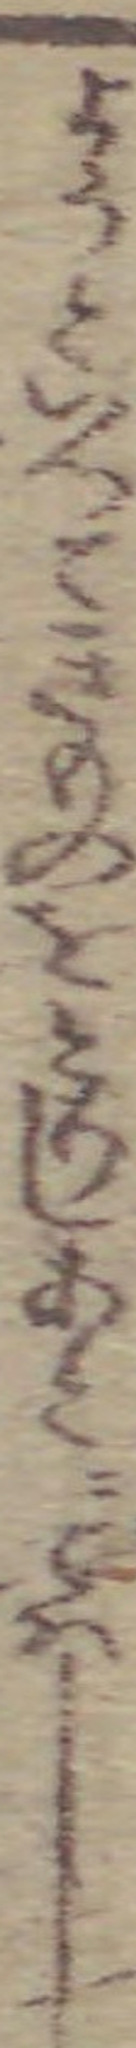ようといつてきものをとりしあとにては
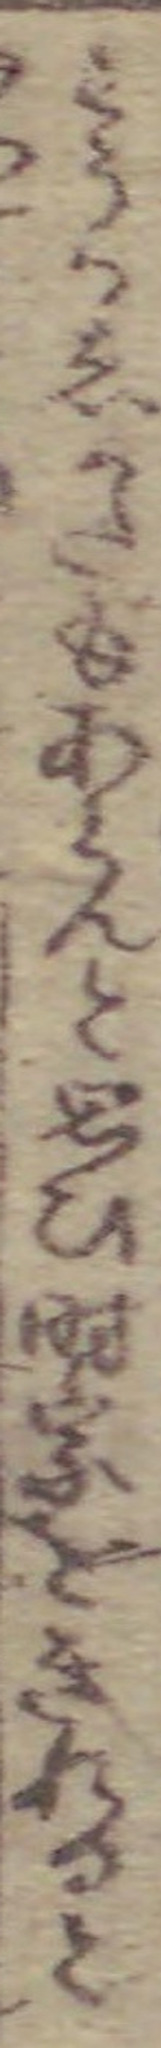とうかしかたもあらんと思ひ時宗をきれると
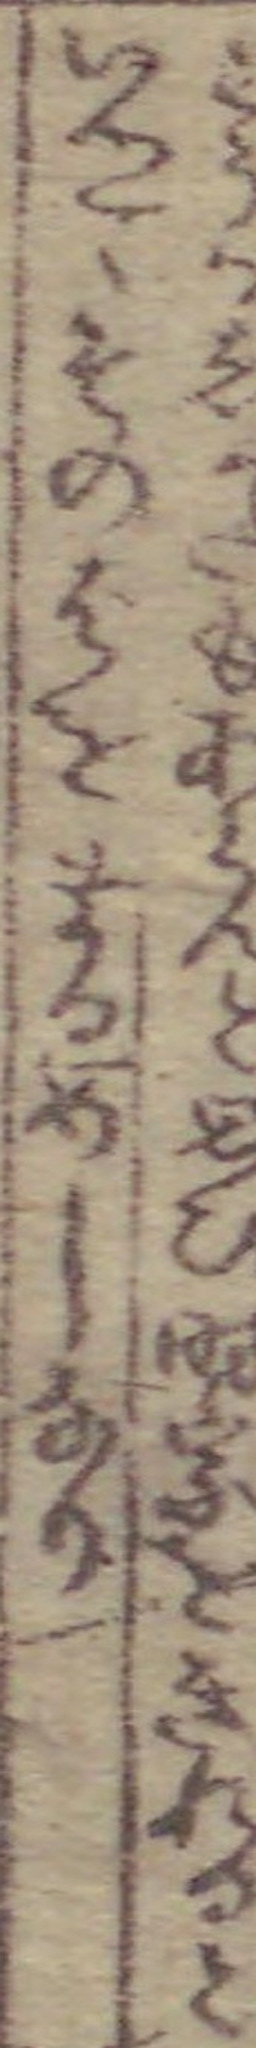いつてそのはをまるめしなり

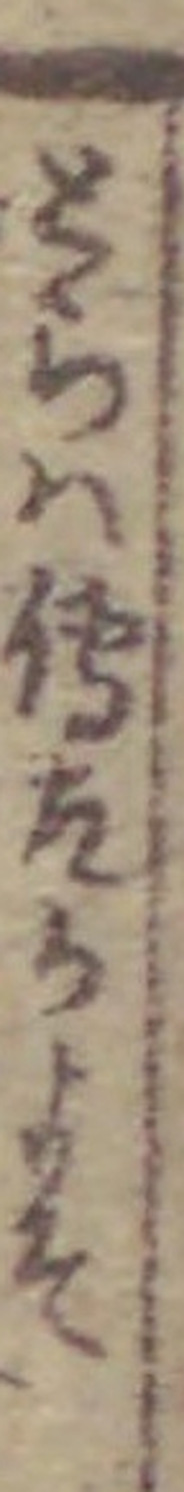とらは伝左かよそ
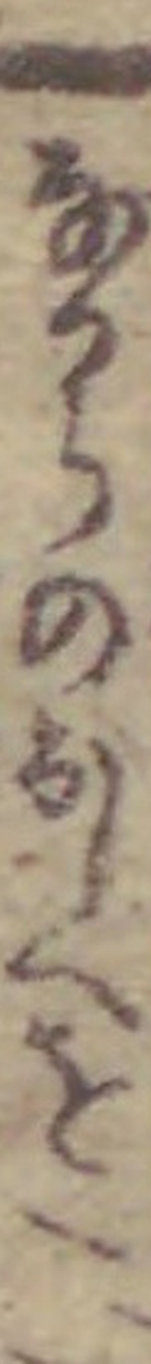なからのおしへを
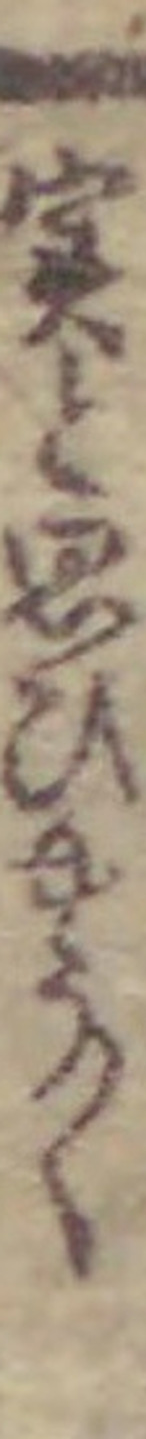実と思ひやう〳〵
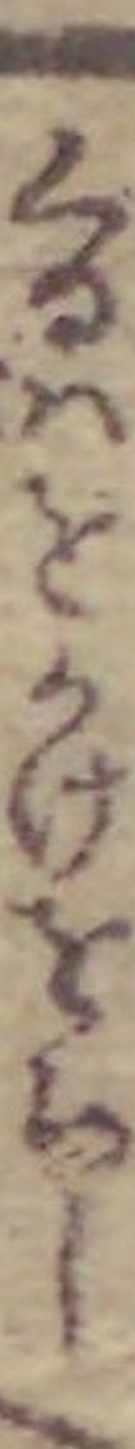くるはをかけをちし
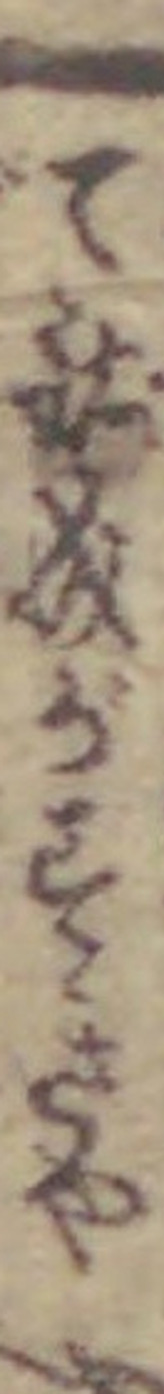て祐成がすきや
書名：間似合嘘言曽我 3巻
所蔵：国立国会図書館 National Diet Library, JAPAN
